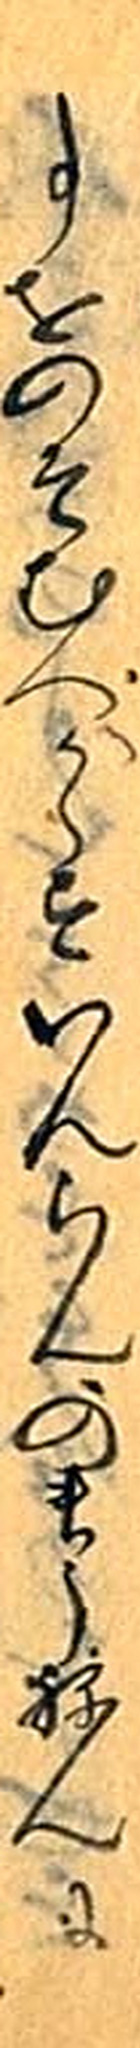事をのそむへからすいんらんのまうねんに
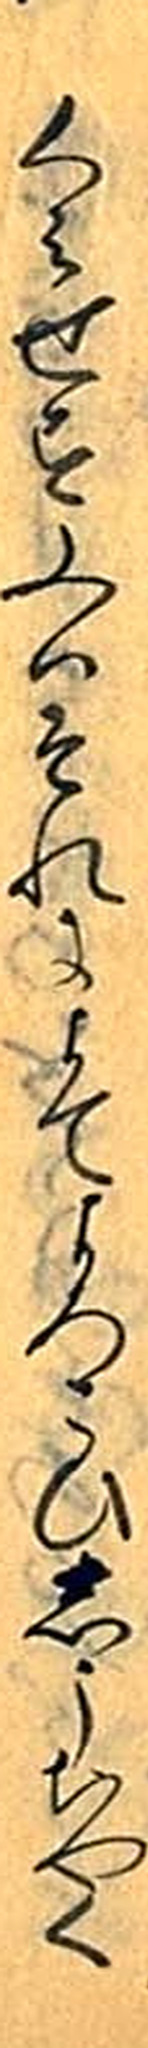くみせす又はそれによてよろこひしうちやく
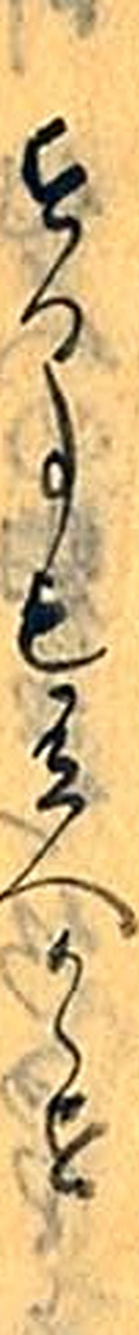する事も有へからす
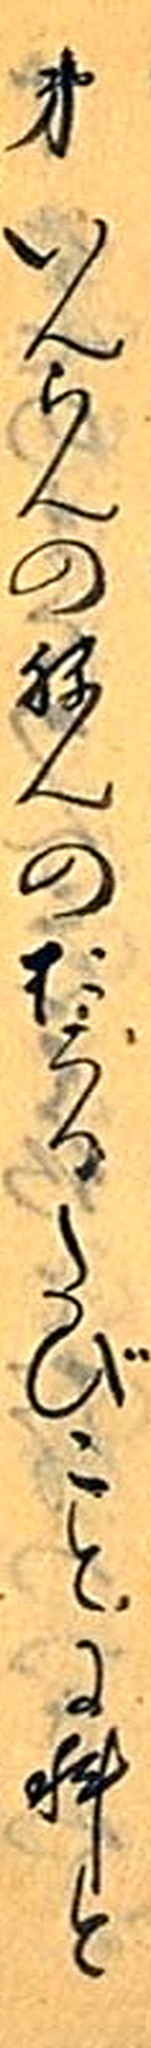弟いんらんのねんのおこるたびことに科と
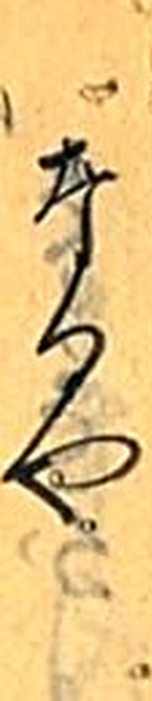なるや
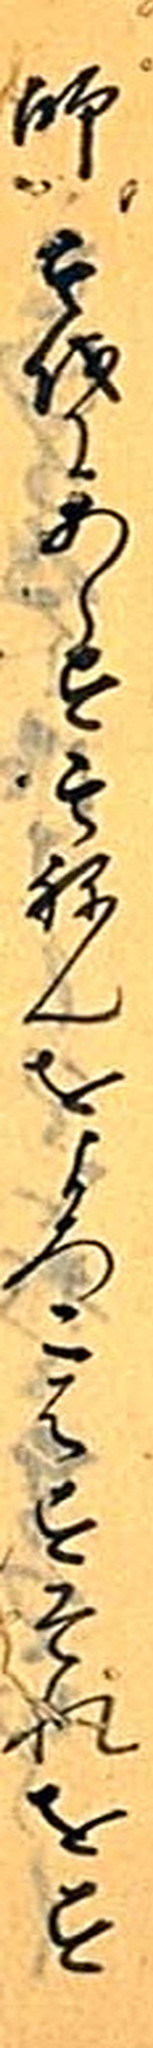師其儀にあらす其ねんをよろこはすそれをす
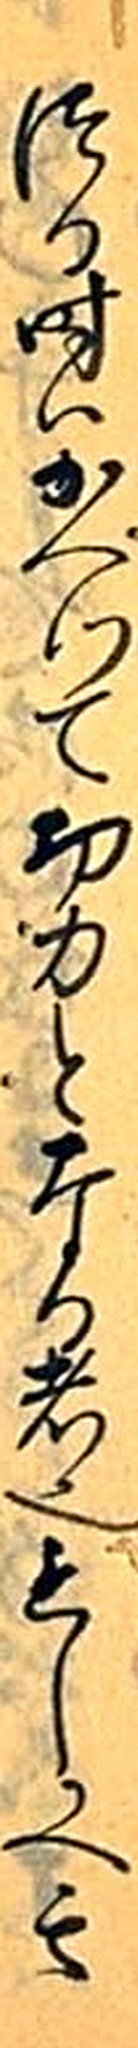つる時はかへつて功力となる者也もし又其
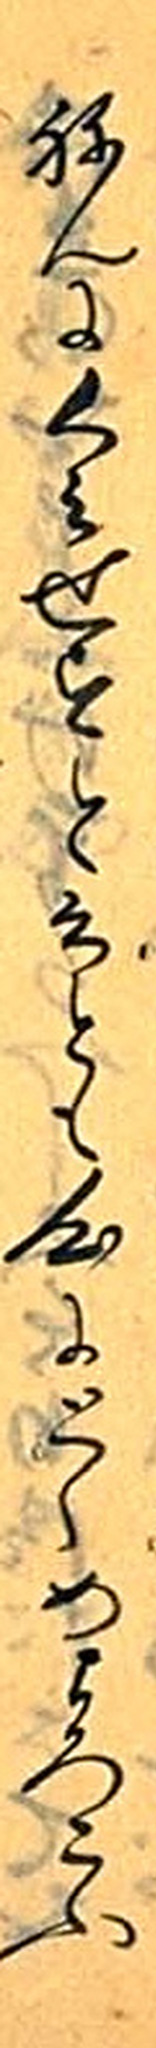ねんにくみせすと云とも心にとゝめよろこふ
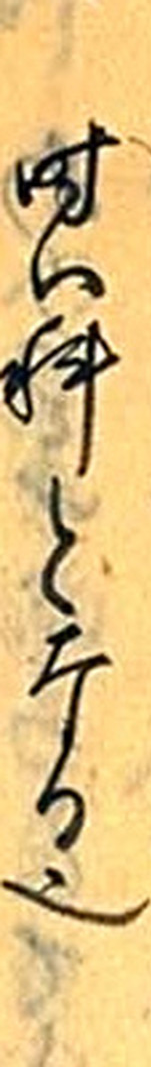時は科となる也
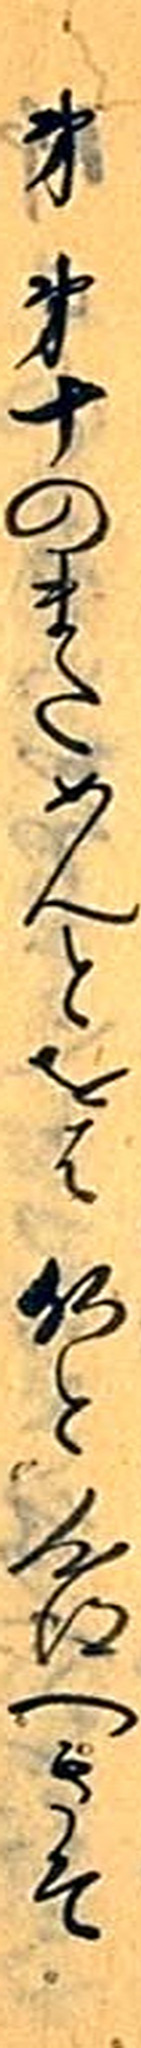弟第十のまためんとをは何と心得へきそ
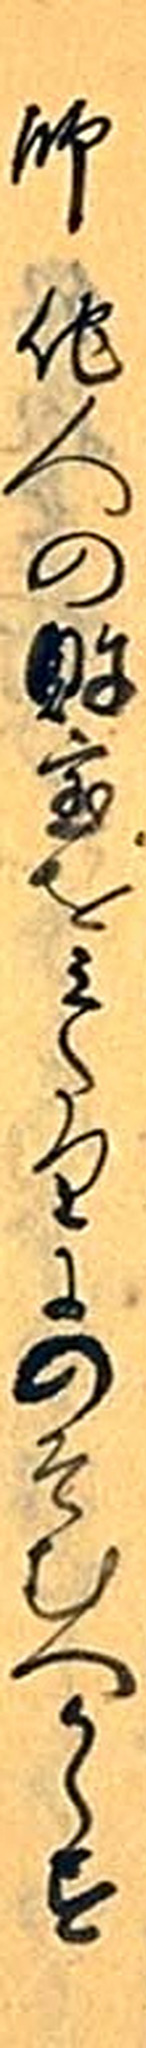師他人の財宝をみたりにのそむへからす
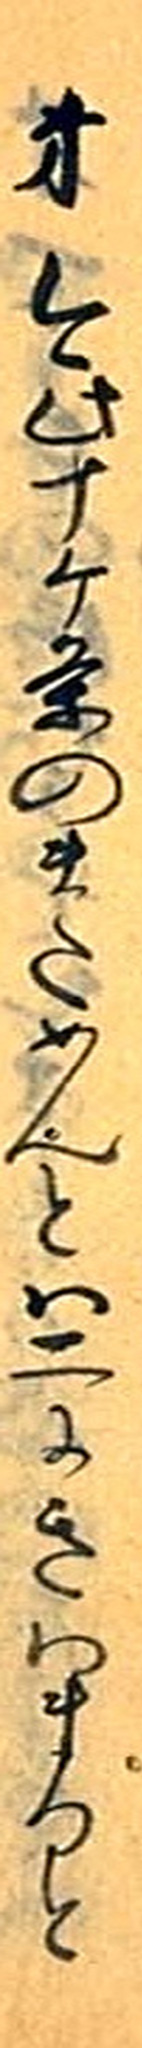弟今此十ケ条のまためんとは二にきはまると
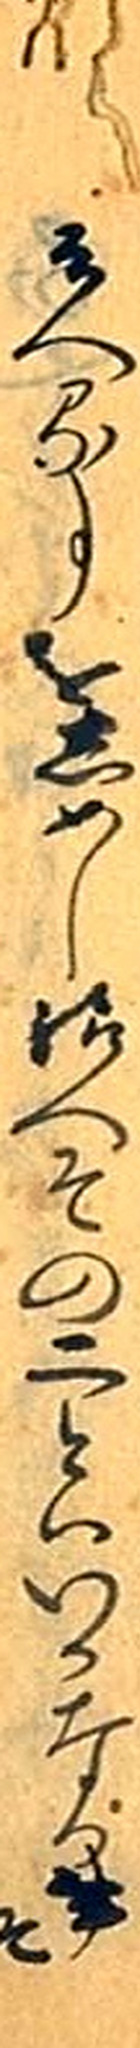云へる事をしめし給へその二とはいかなる事そ
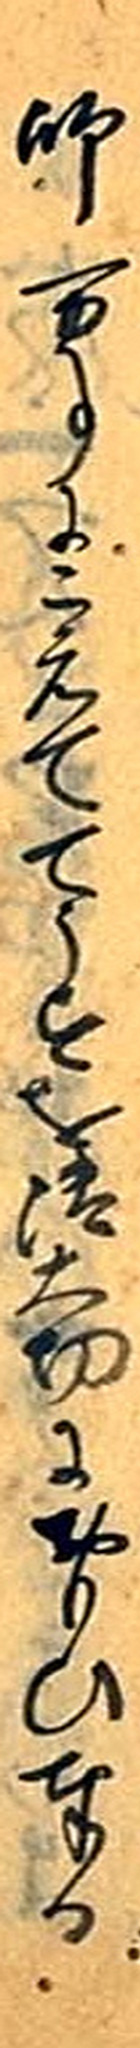師万事にこえててうすを御大切におもひ奉る
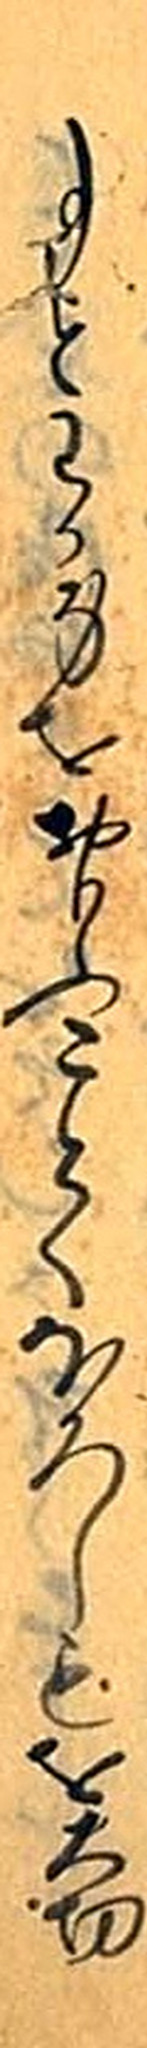事とわか身をおもふことくほろしもを大切
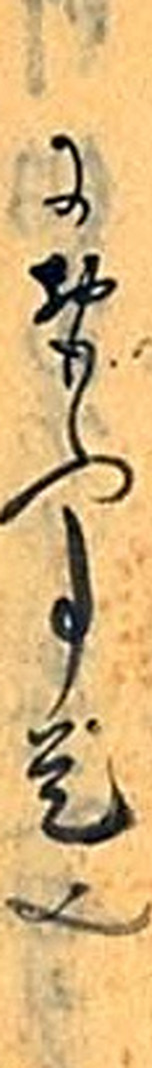におもふ事是也
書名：ドチリナ・キリシタン
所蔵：東京大学総合図書館 / General Library in the University of Tokyo
